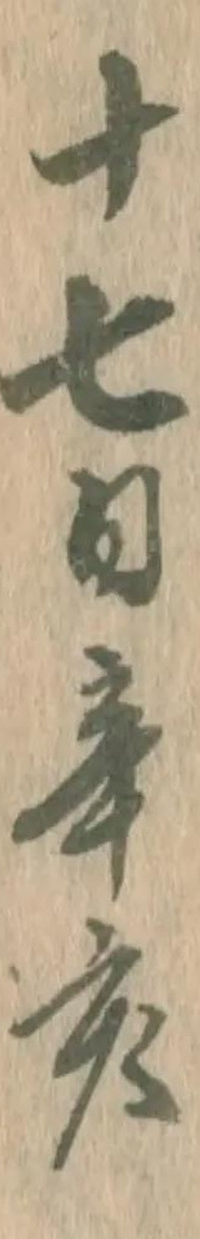十七日辛亥
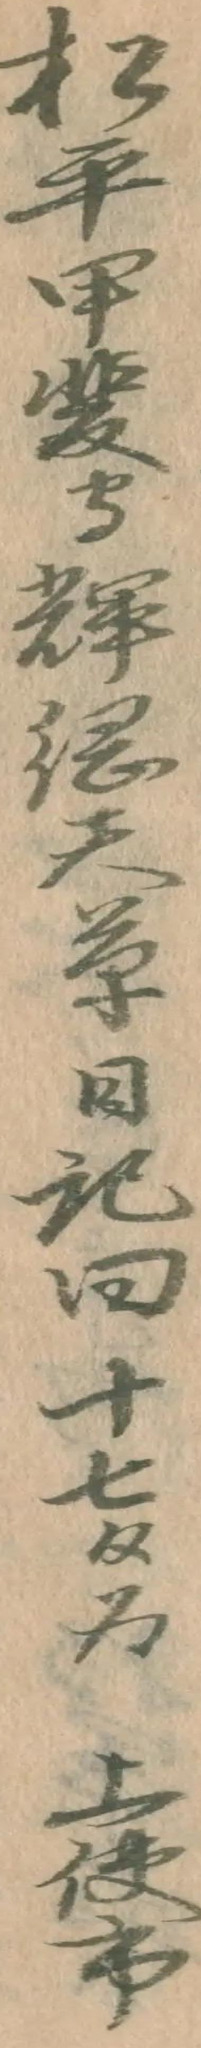松平甲斐守輝綱天草日記曰十七日為上使市
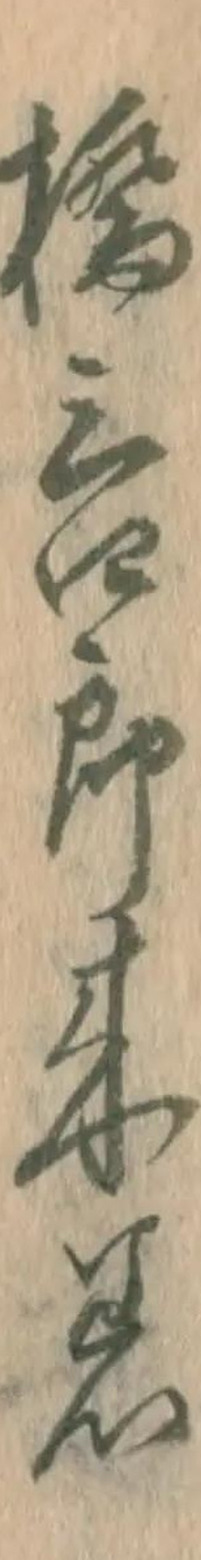橋三四郎来着
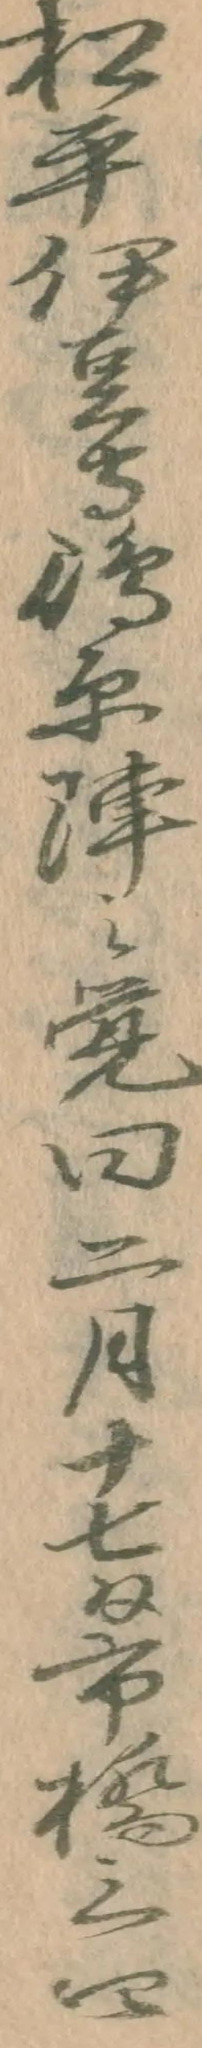松平伊豆守島原陣之覚曰二月十七日市橋三四
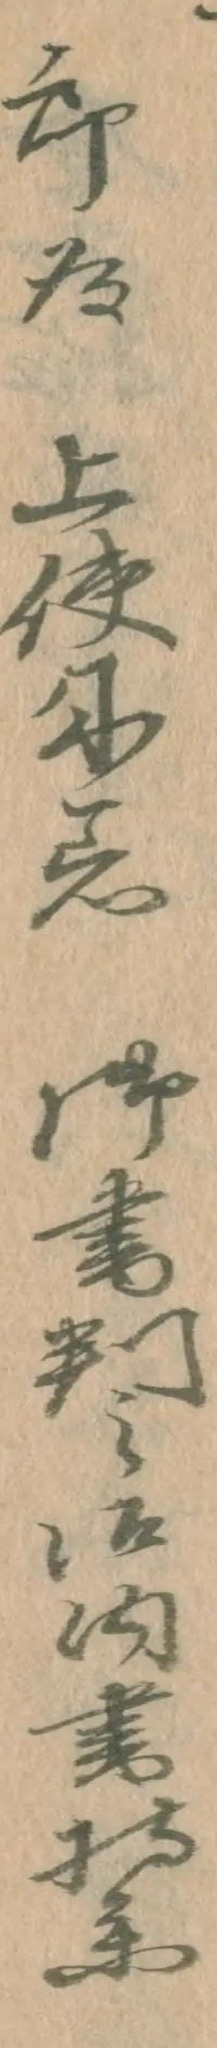郎為上使来着御書判之御内書持参
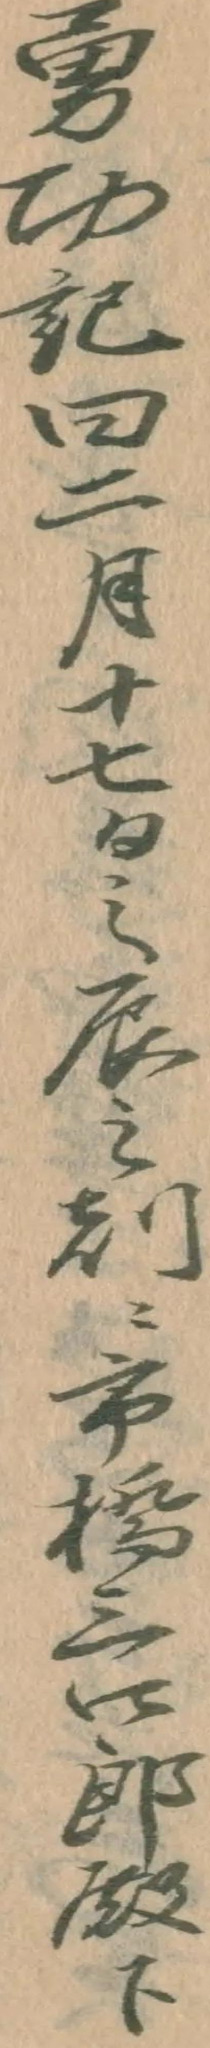勇功記曰二月十七日之辰之刻に市橋三四郎殿下
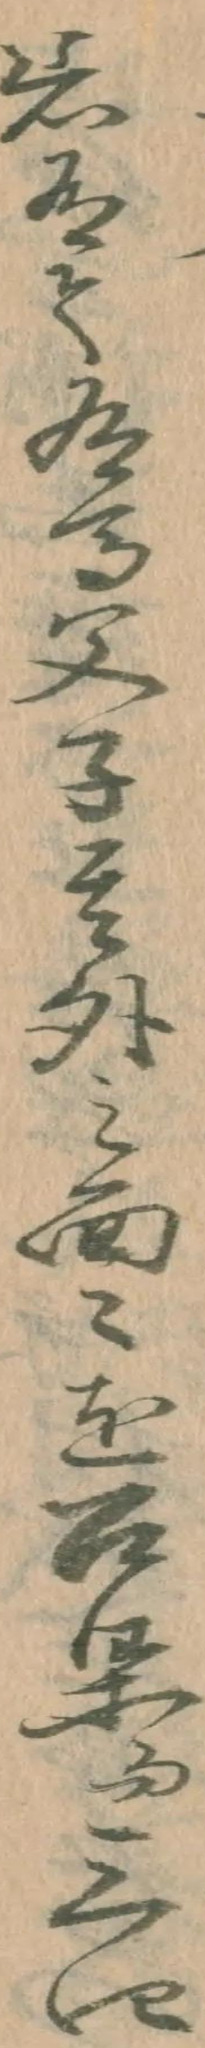着有て有馬父子其外之面々を召集而三四
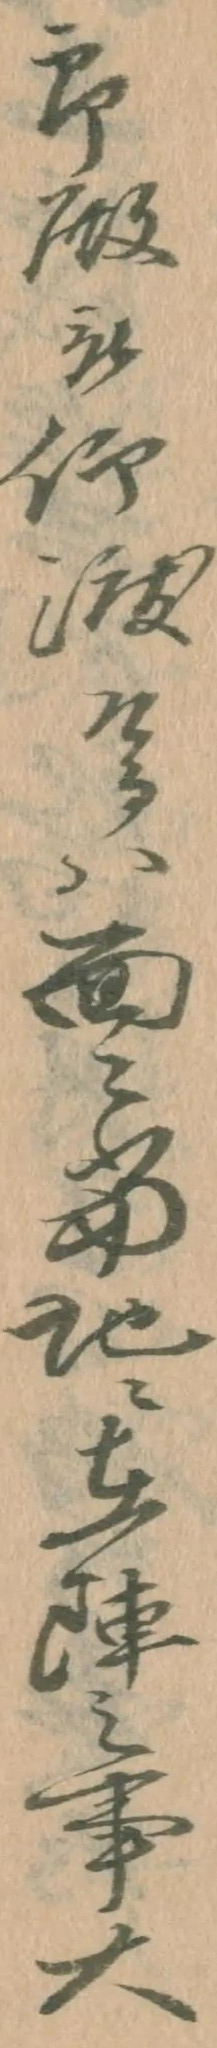郎殿被仰渡けるは面々当地に在陣之事大
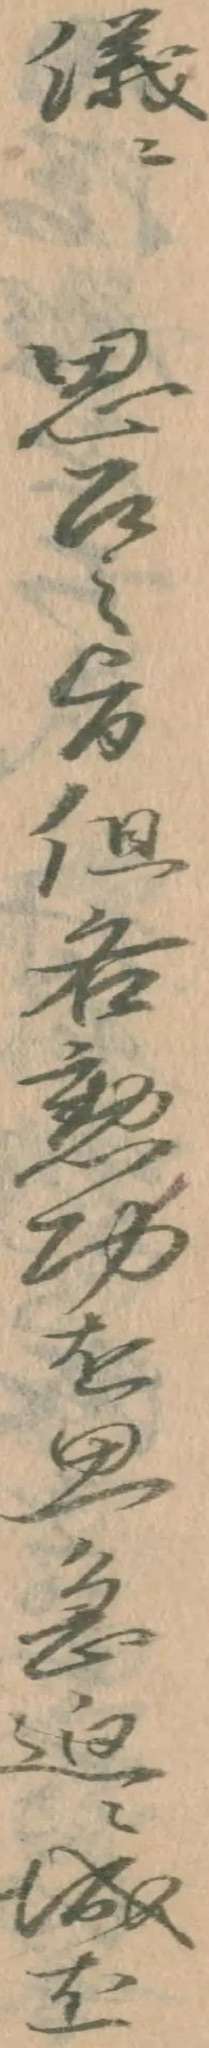儀に思召之旨但各勲功を思急迫に城を
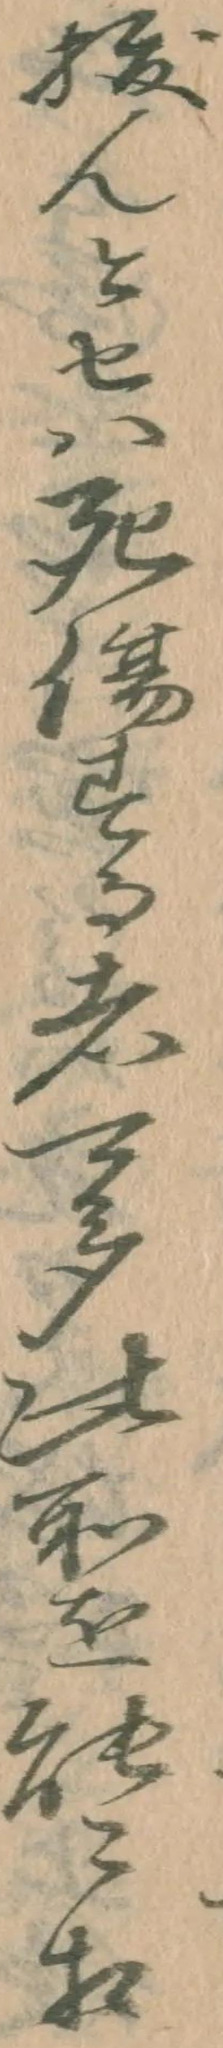抜んとせは死傷春る者可多此所を能々相
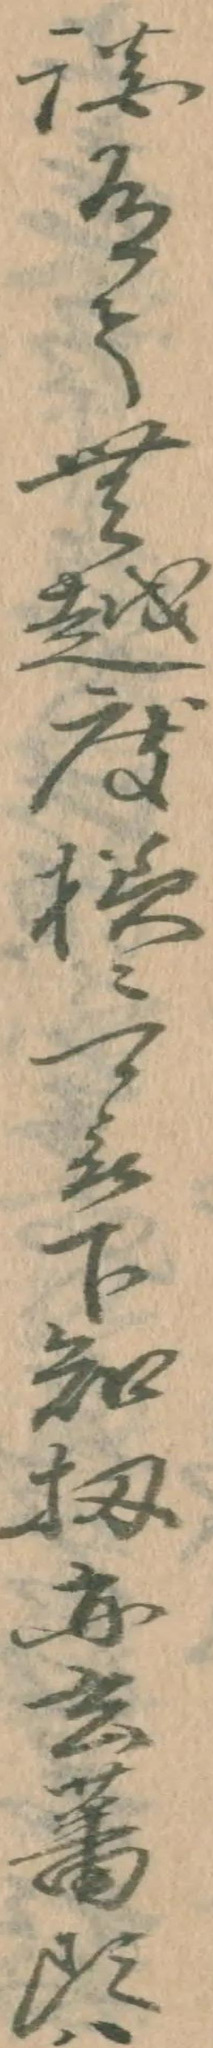謀有て無越度要様に可被下知扨亦玄蕃頭は
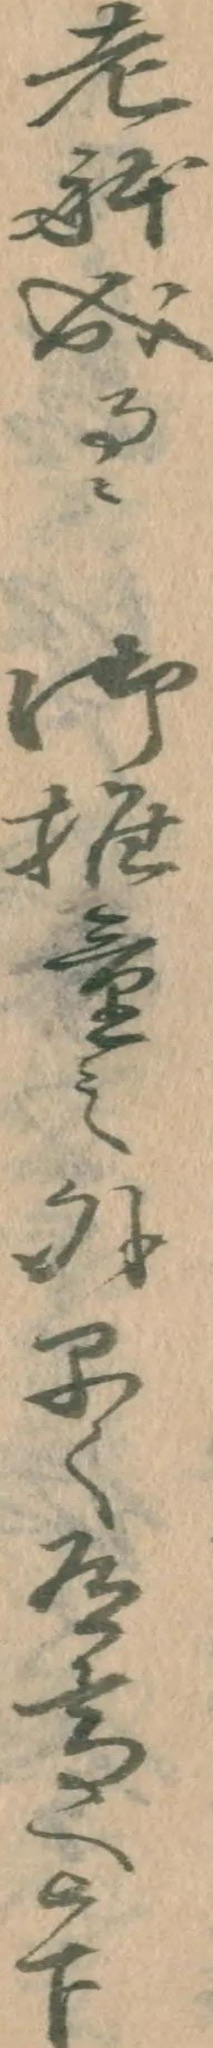老躰成るに御推量之外早く有馬へ被下
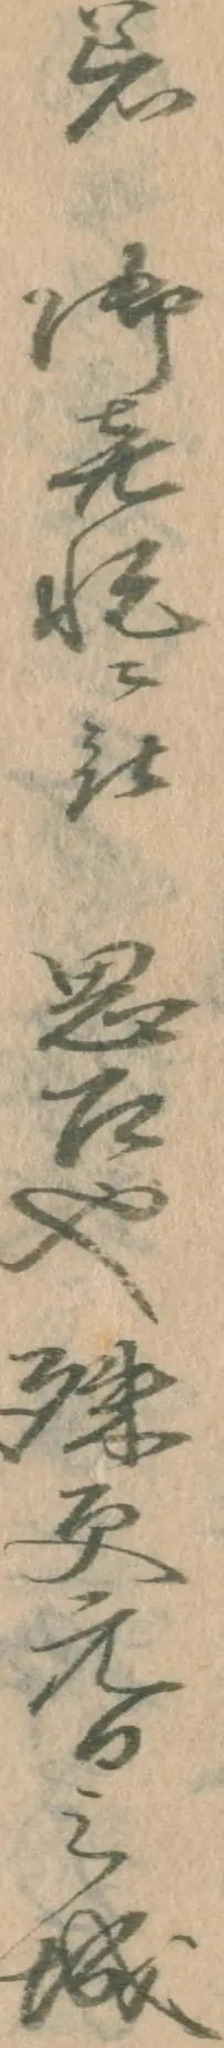着御喜悦に被思召也殊更元日之城
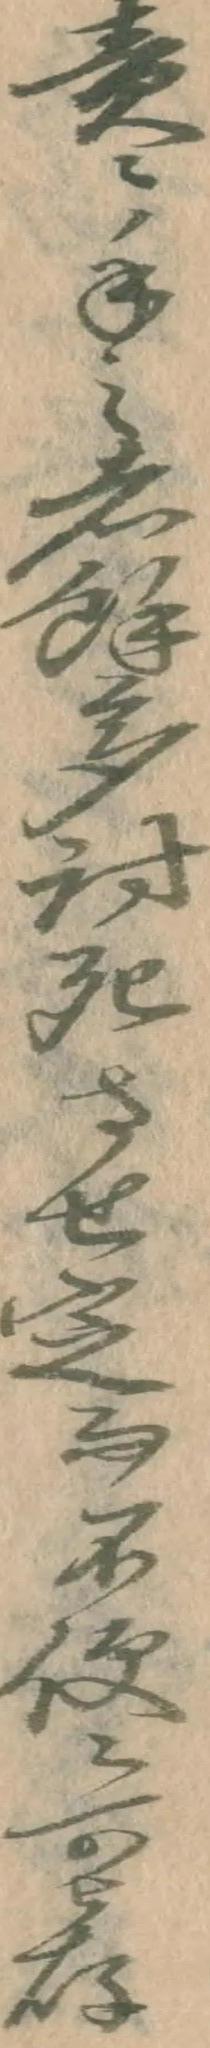責に手之者餘多討死させ定而不便に可被存
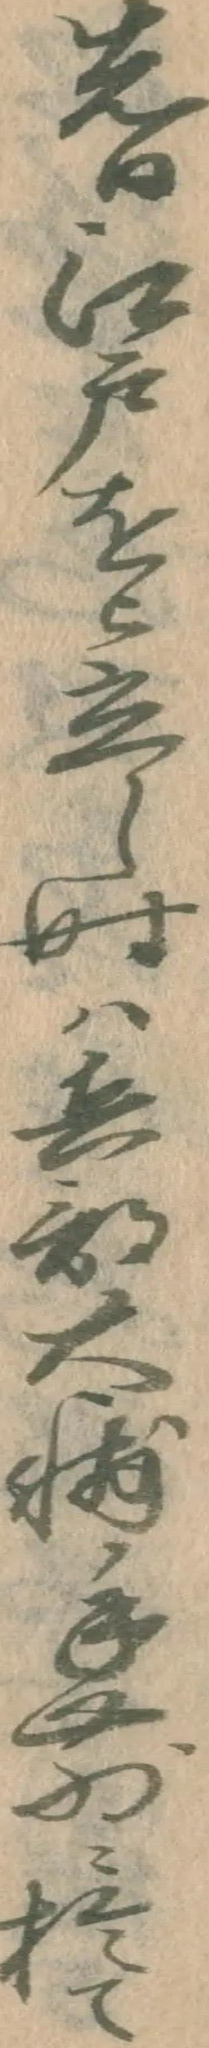先日江戸を被立之時は兵部太輔手前に於て
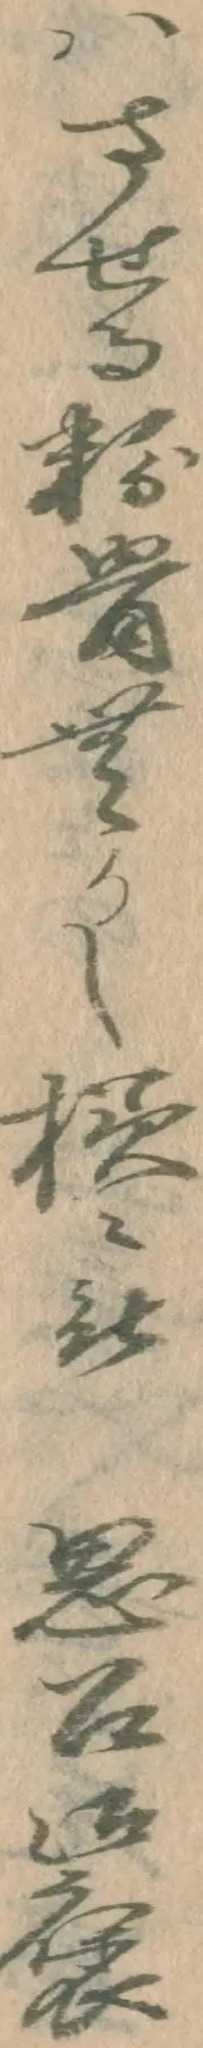はさせる粉骨無りし様に被思召御褒
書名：切支丹御退治記 49巻. [6]
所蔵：国立国会図書館 National Diet Library, JAPAN
